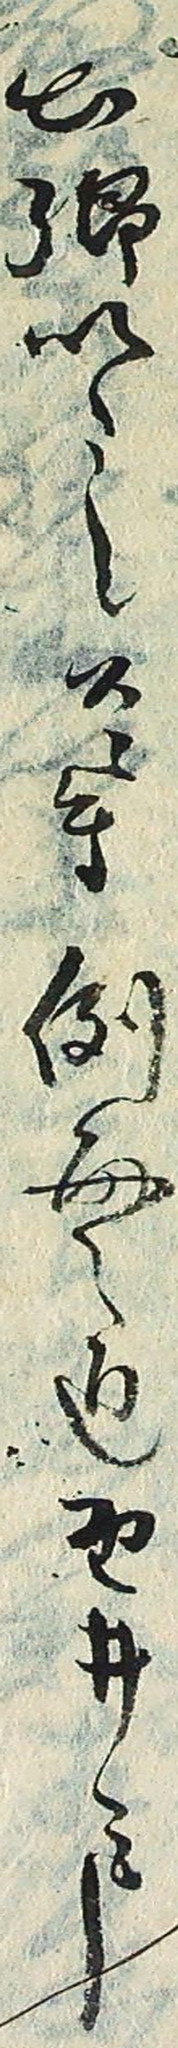出郷いたし候に付例毎之通野井戸
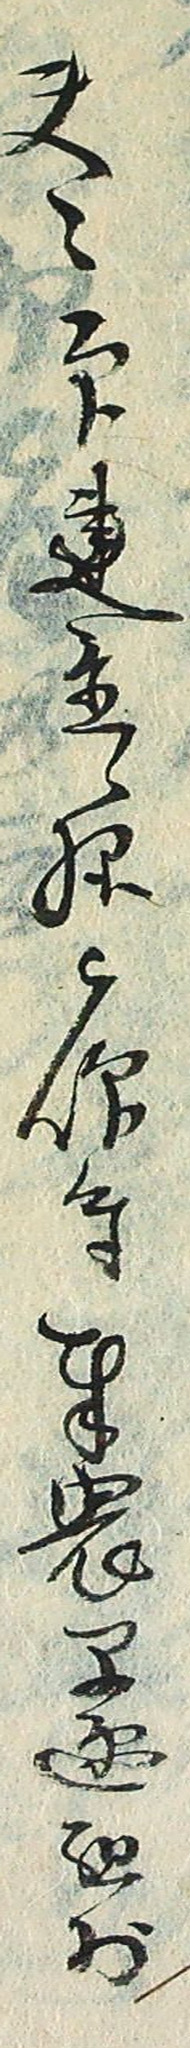夫々印建置候様被仰付奉畏早速組村
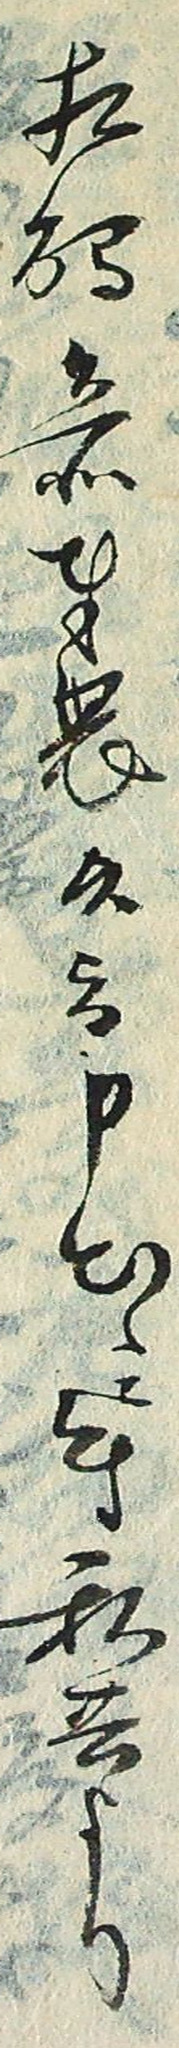相触候所奉畏候旨申出候に付私共より
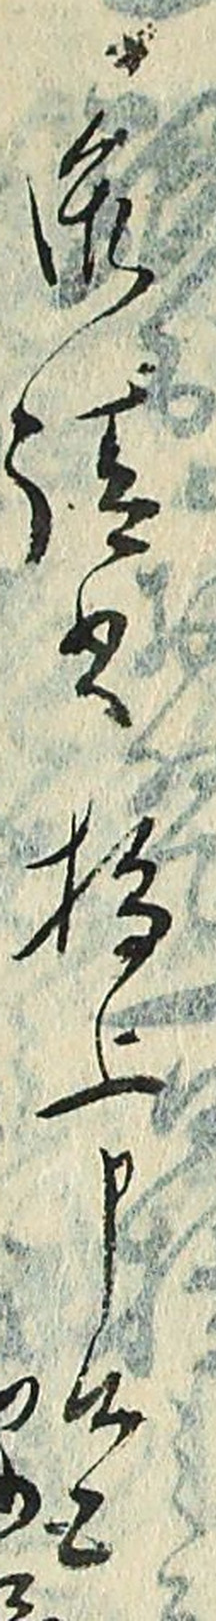御請書指上申候以上
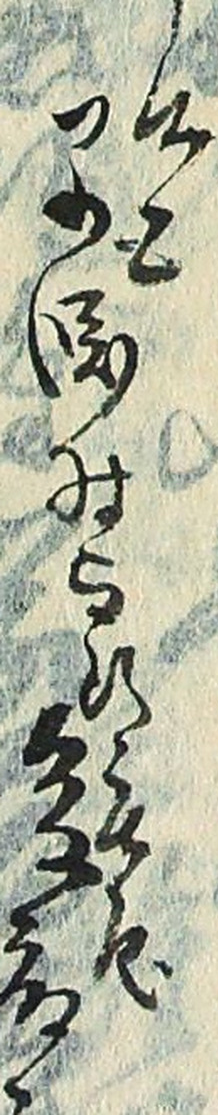早淵村与頭庄屋
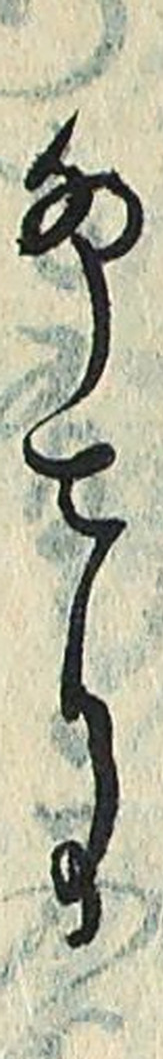卯七月
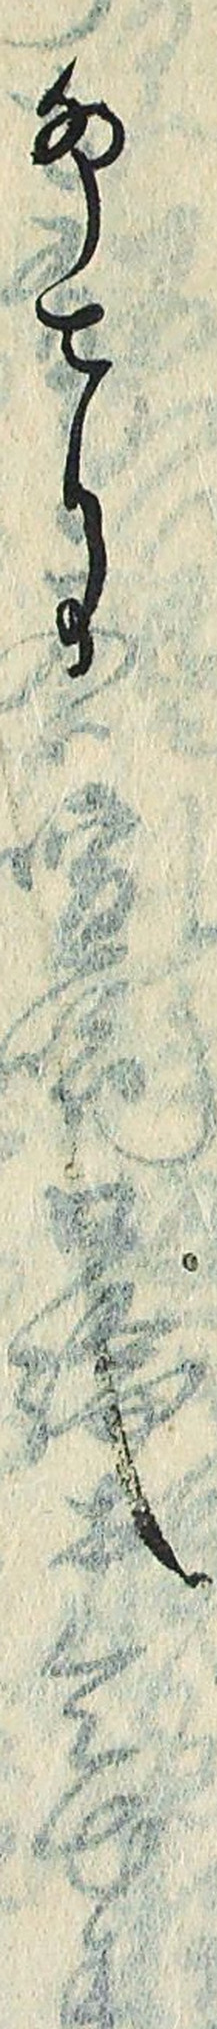卯七月
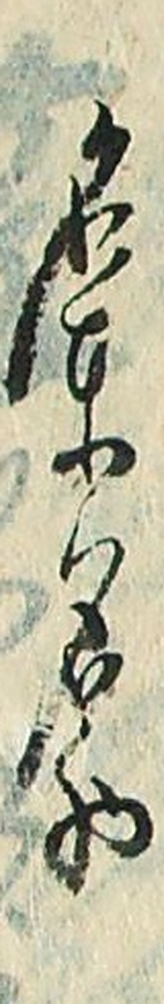名東名西
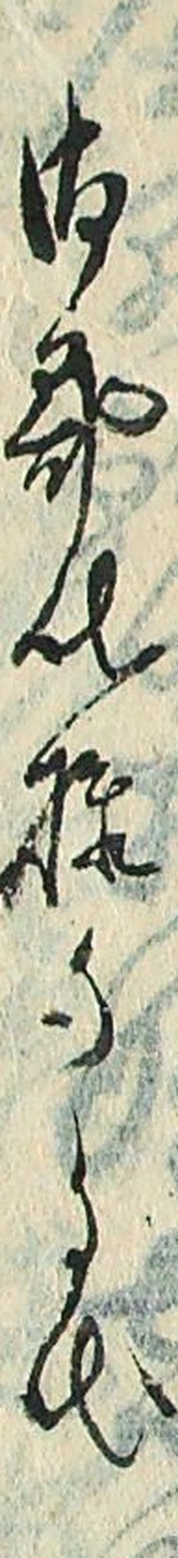御郡代様御手代
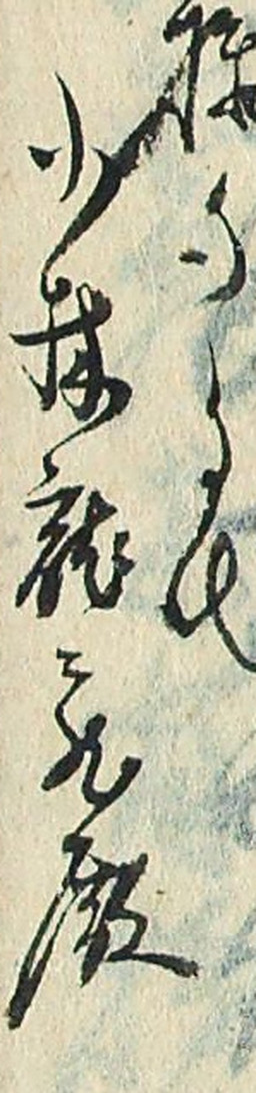小林龍蔵殿

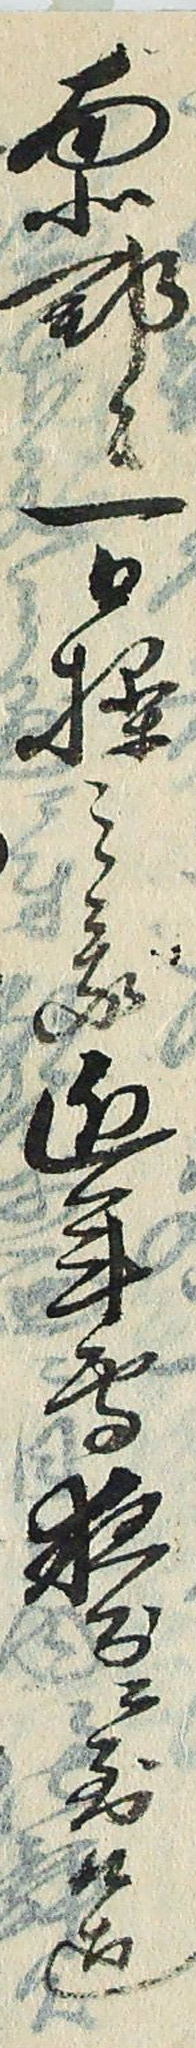南北郡々一日操之義近年専夜分に至候迄
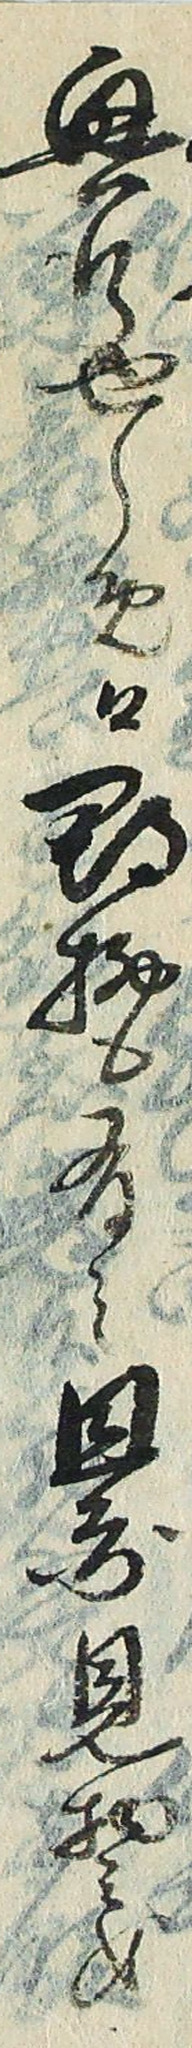興行せしめ候郡柄も有之且亦見物之義
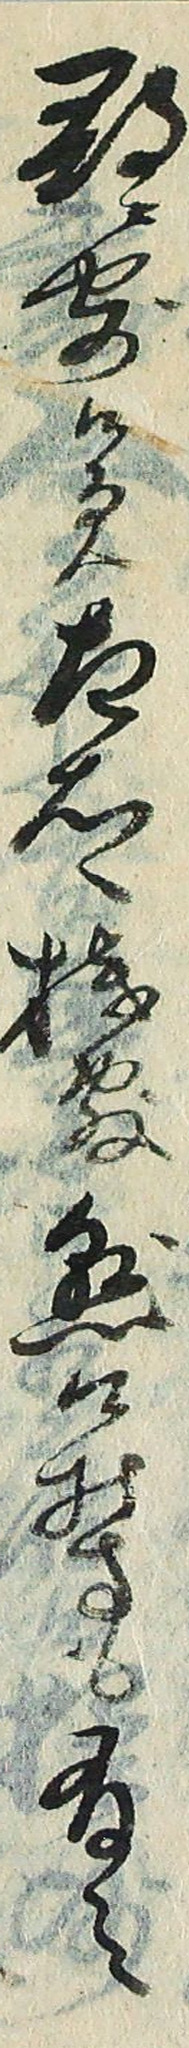郡に寄候ては左右へ桟敷懸候村方も有之
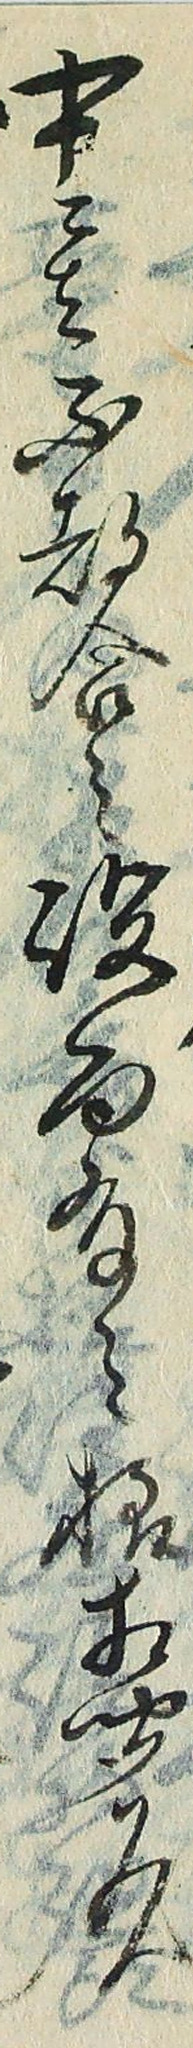中には不都合之役向有之様相聞候へは
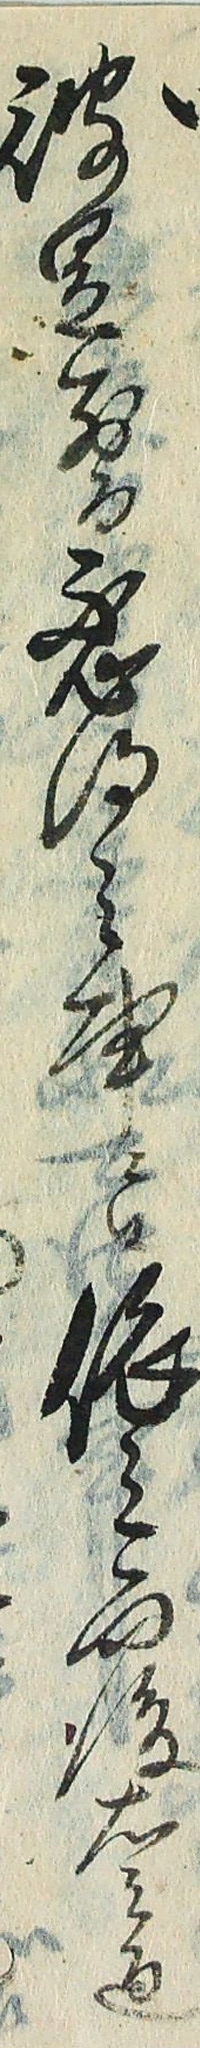彼是別而不心得之事に候依之向後右之通
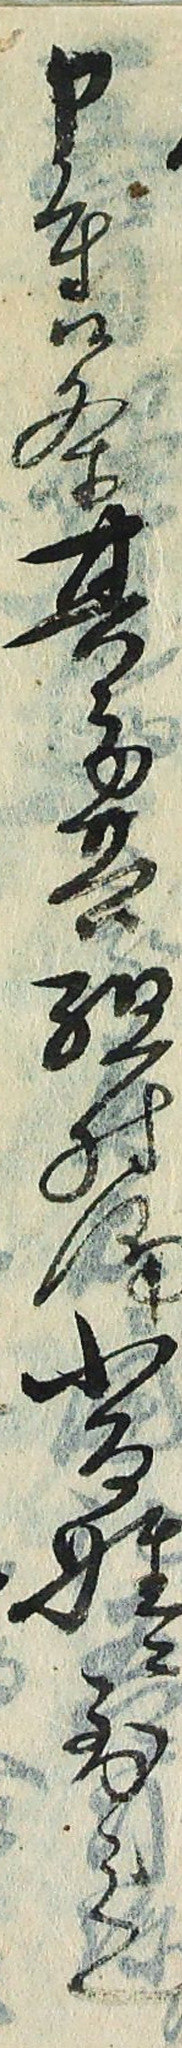申付候条其方共組村浦小百姓に至迄
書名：諸御用御□受書控
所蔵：鳴門教育大学 Naruto University of Education
